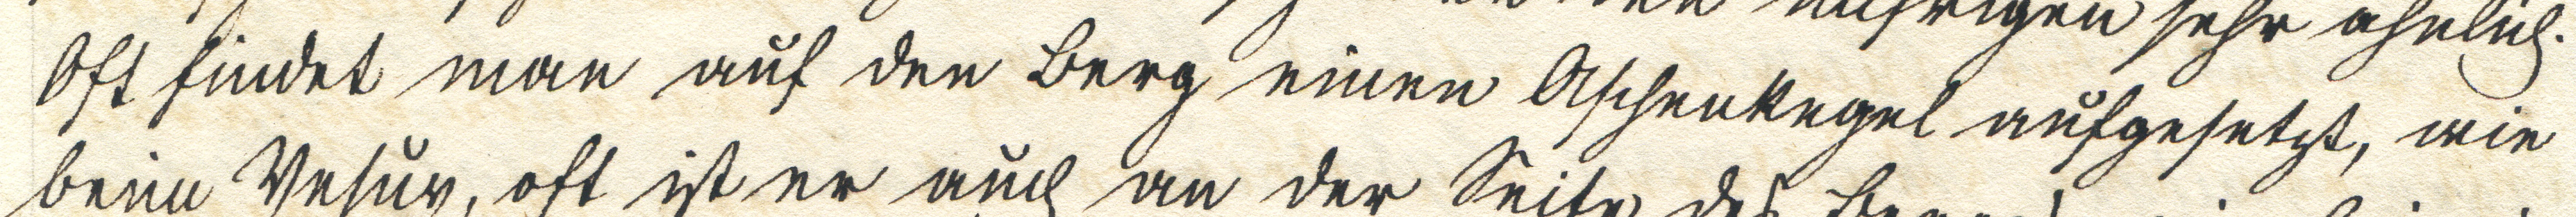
Oft findet man auf den Berg einen Aschenkegel aufgesetzt, wie
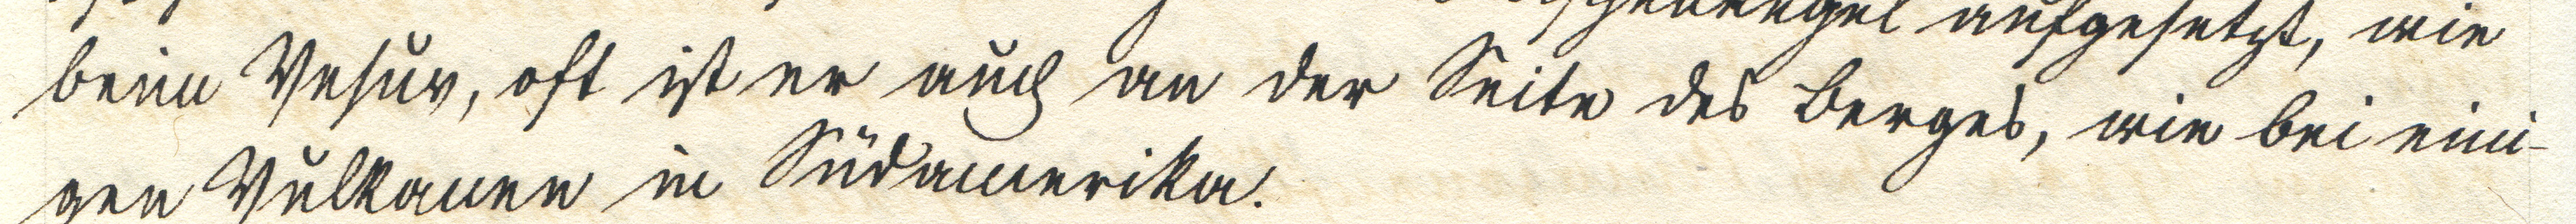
beim Vesuv, oft ist er auch an der Seite des Berges, wie bei eini-
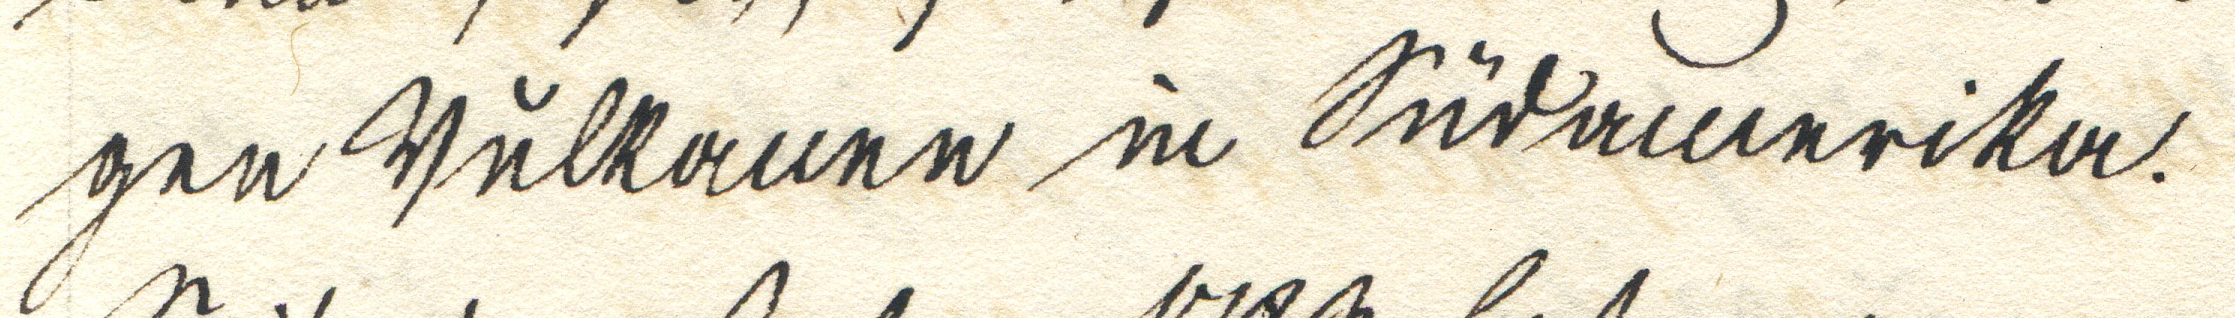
gen Vulkanen in Südamerika.
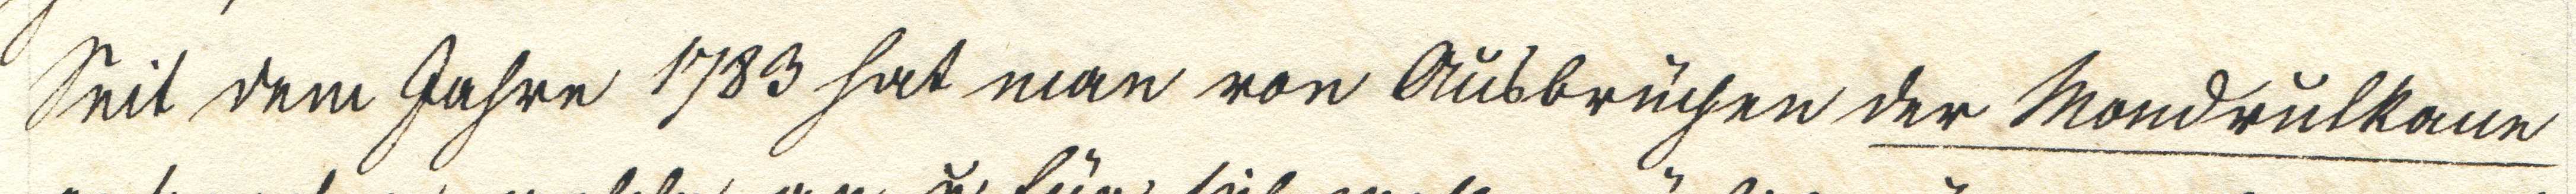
Seit dem Jahre 1783 hat man von Ausbrüchen der Mondvulkane
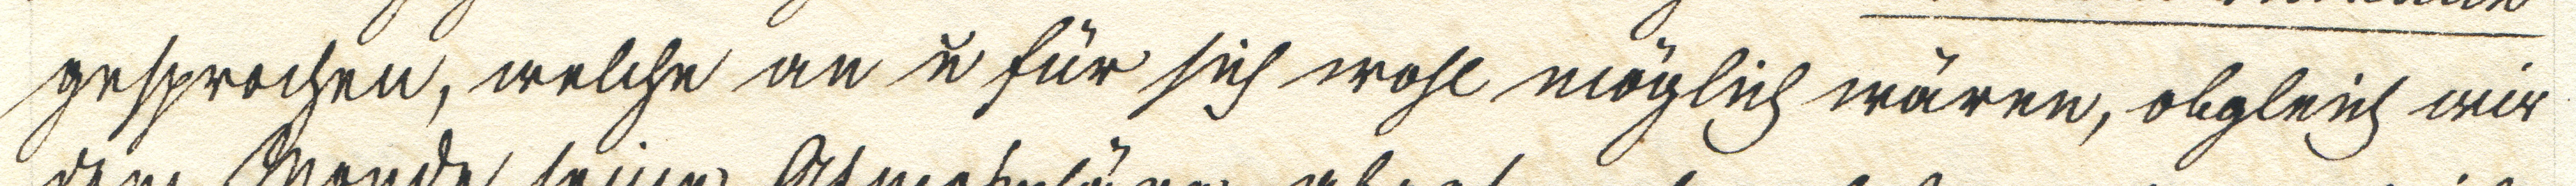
gesprochen, welche an u für sich wohl möglich wären, obgleich wir
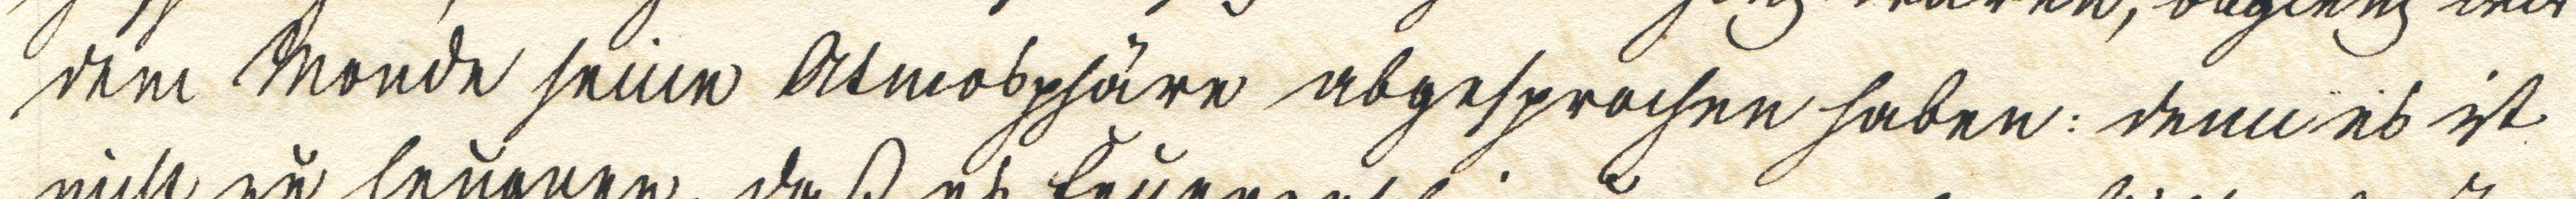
dem Monde seine Atmosphäre abgesprochen haben: denn es ist
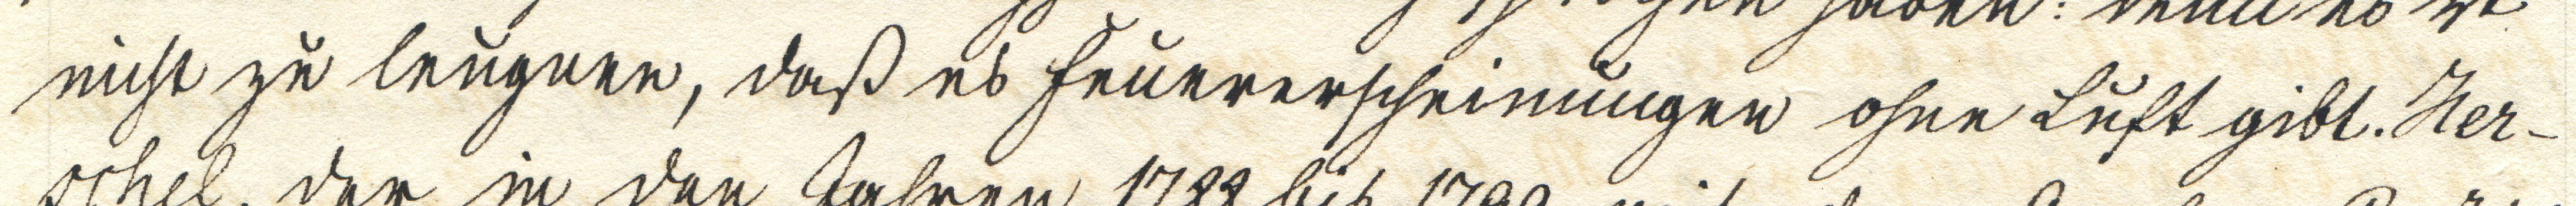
nicht zu leugnen, daß es Feuererscheinungen ohne Luft gibt. Her-
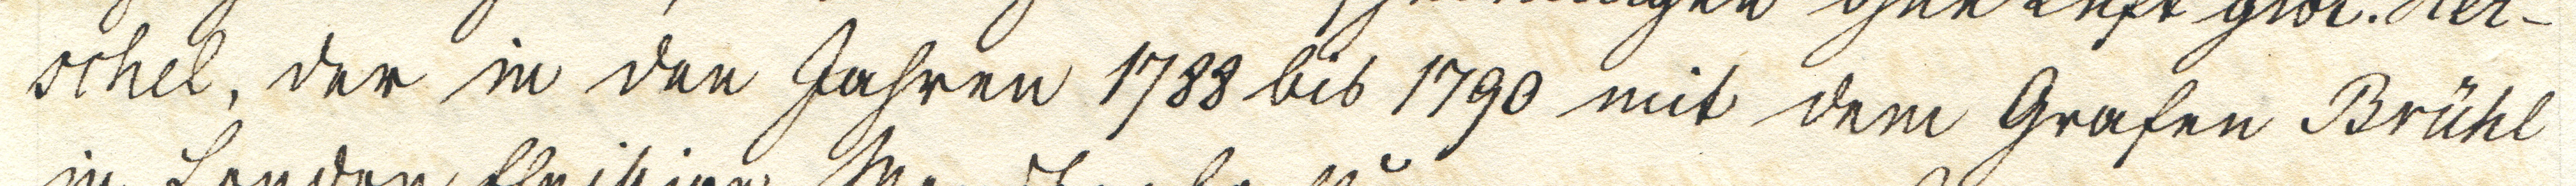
schel, der in den Jahren 1788 bis 1790 mit dem Grafen Brühl
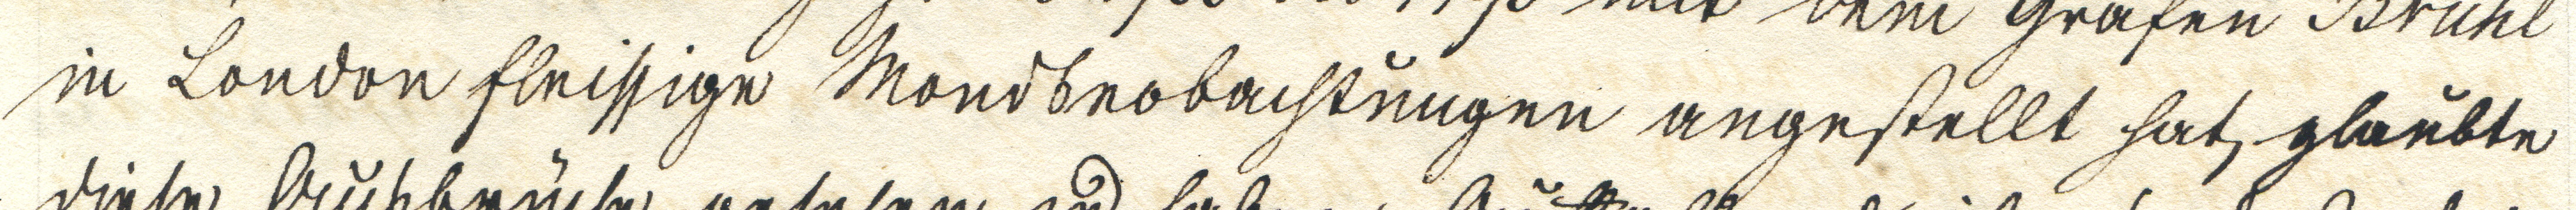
in London fleissige Mondbeobachtungen angestellt hat, glaubte
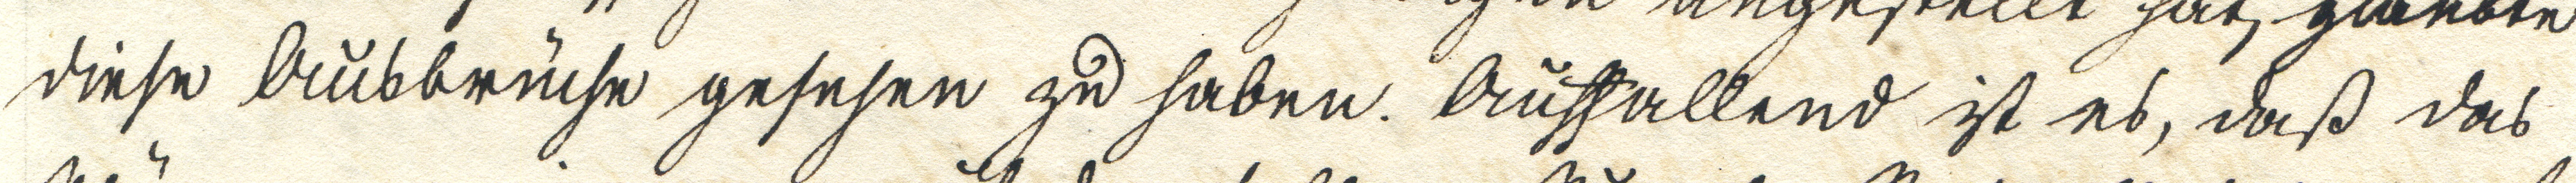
diese Ausbrüche gesehen zu haben. Auffallend ist es, daß das
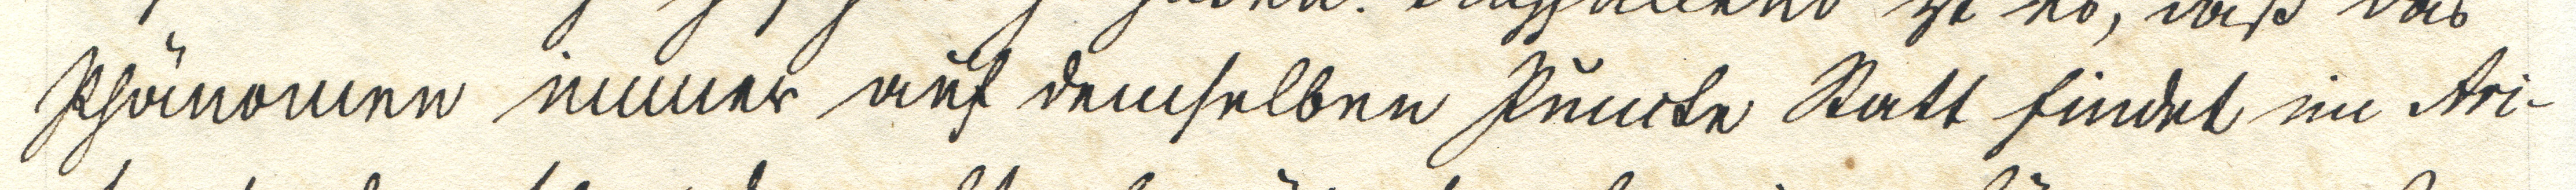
Phänomen immer auf demselben Puncte Statt findet, im Ari-
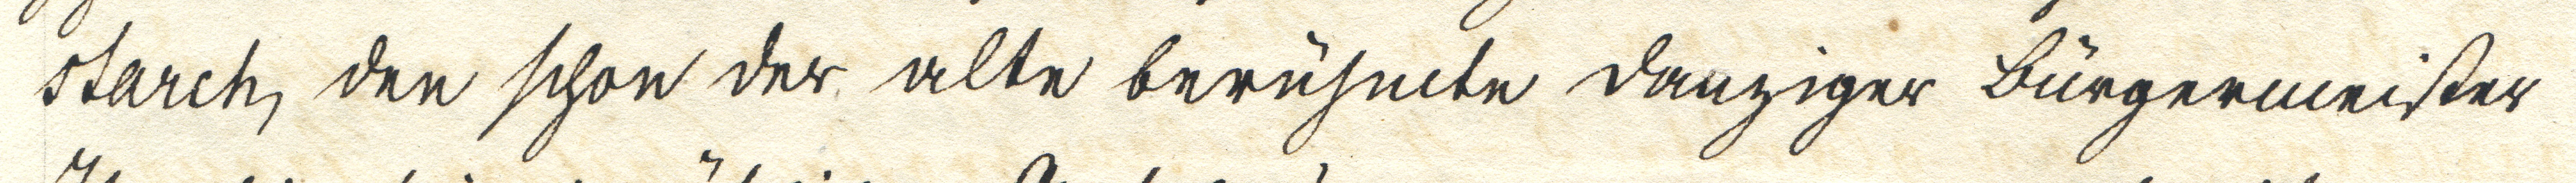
starch, den schon der alte berühmte Danziger Bürgermeister
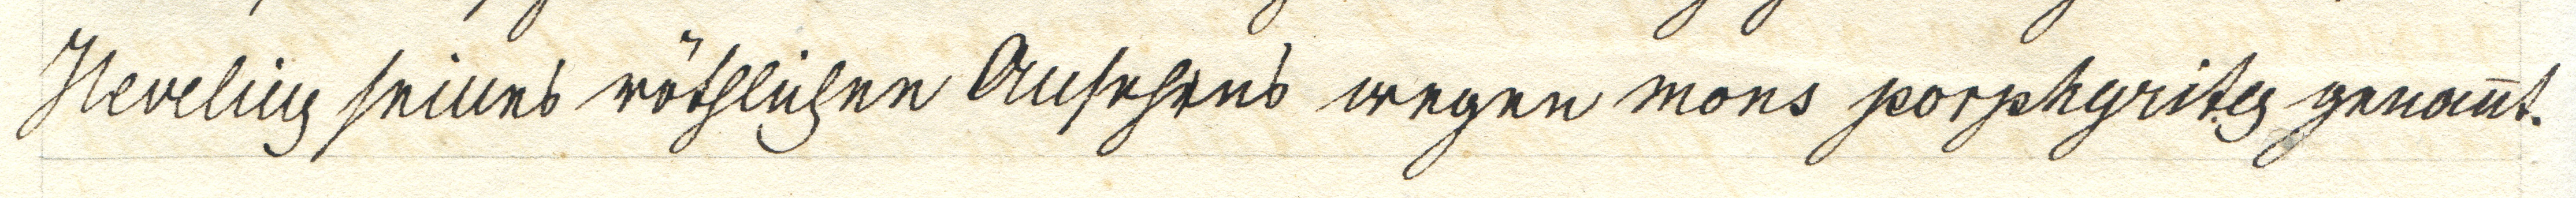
Hevelius seines röthlichen Ansehens wegen mons porphyrites genañt.
